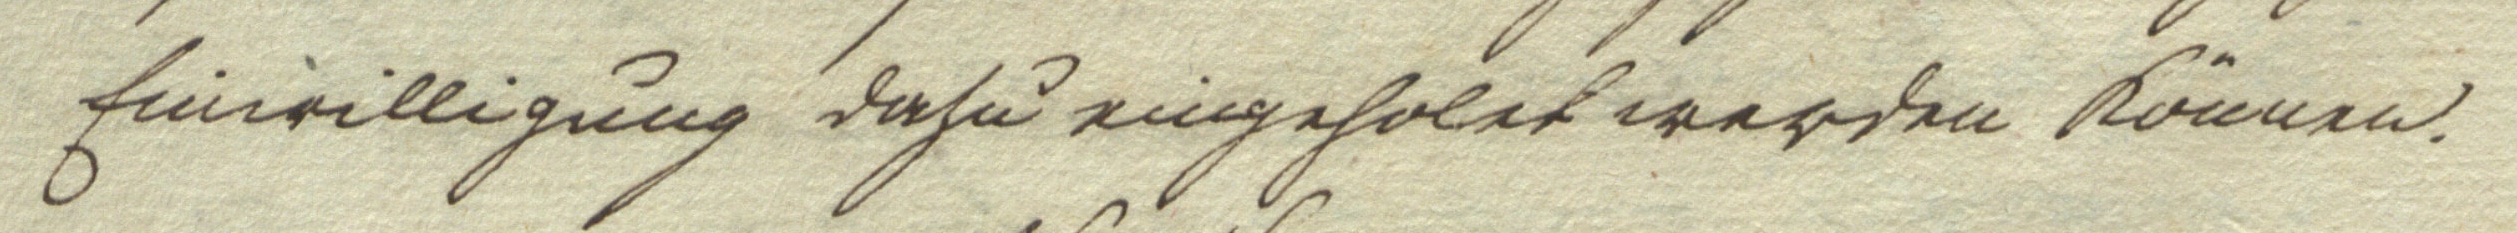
Einwilligung dazu eingeholet werden können.
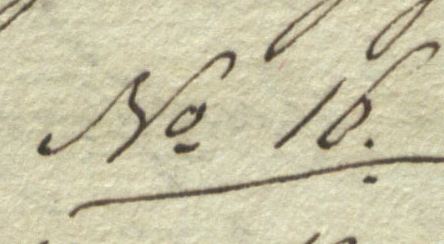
No 16.
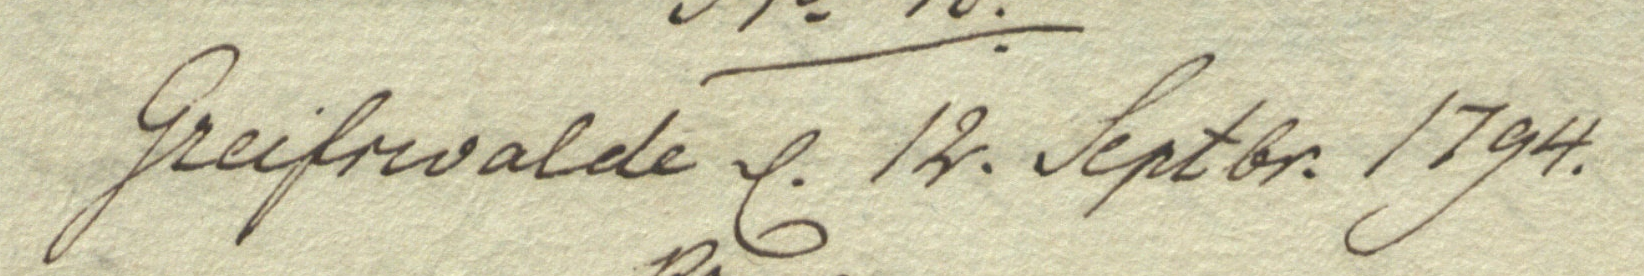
Greifswalde d. 12. Septbr. 1794.
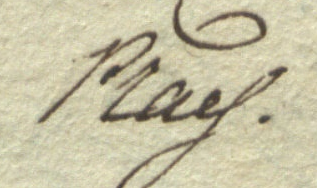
Praes.
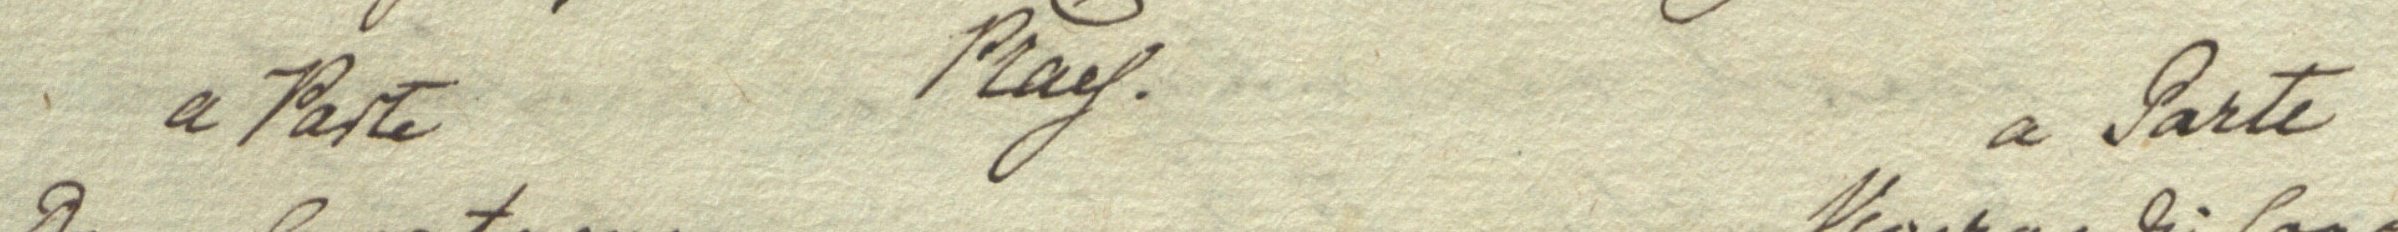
a Parte a Parte
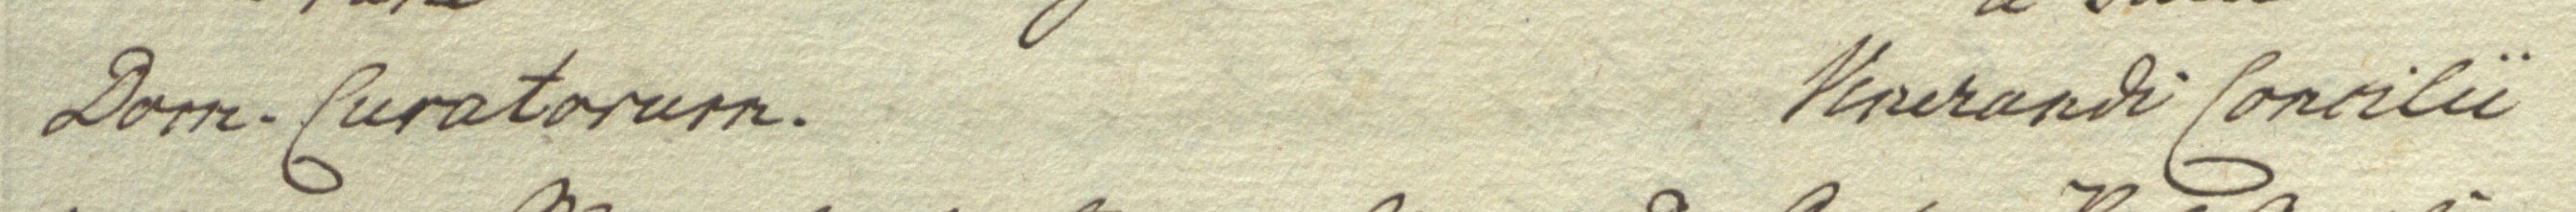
Dom. Curatorum. Venerandi Concilii
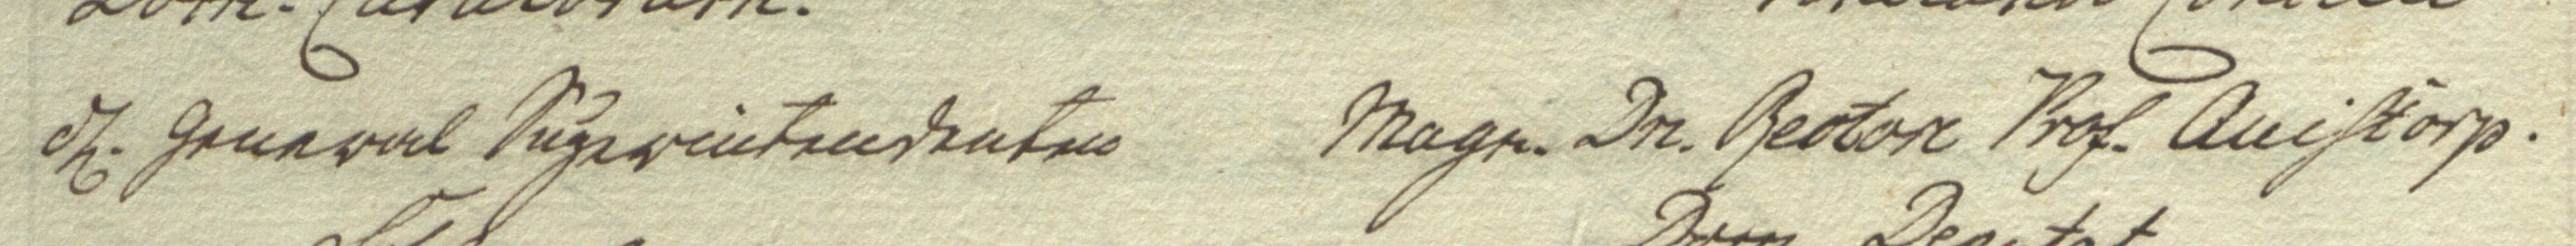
dh. General Superintendenten Magn. Dn. Rector Prof. Quistorp.
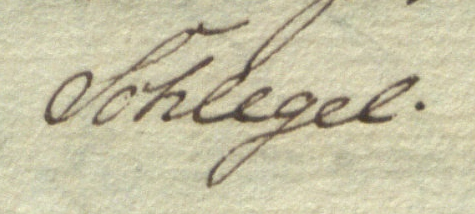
Schlegel.
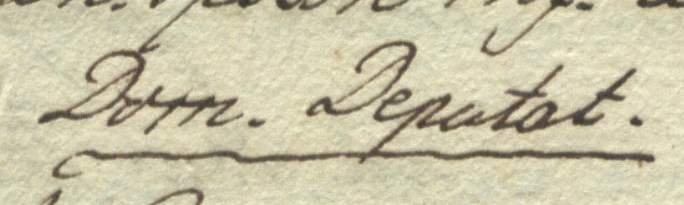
Dom. Deputat.
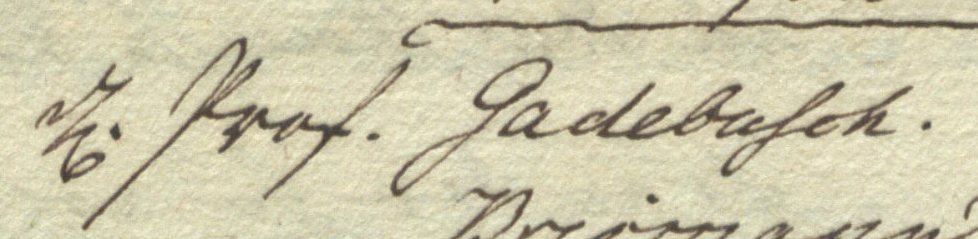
dh. Prof. Gadebusch.
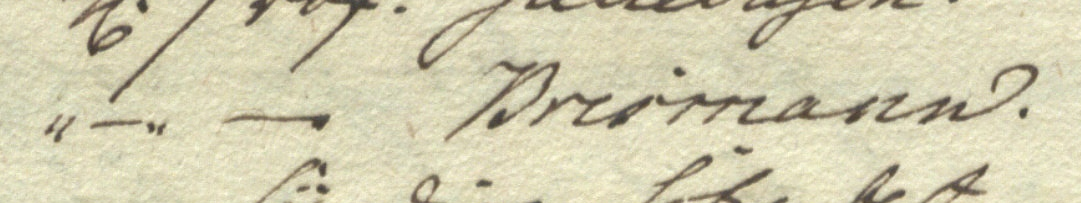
Brismann.
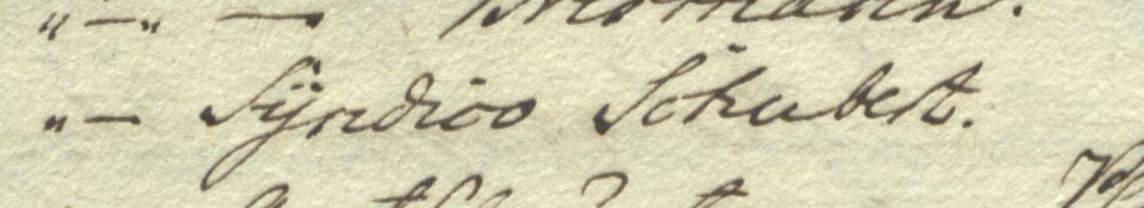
Sÿndico Schubert.
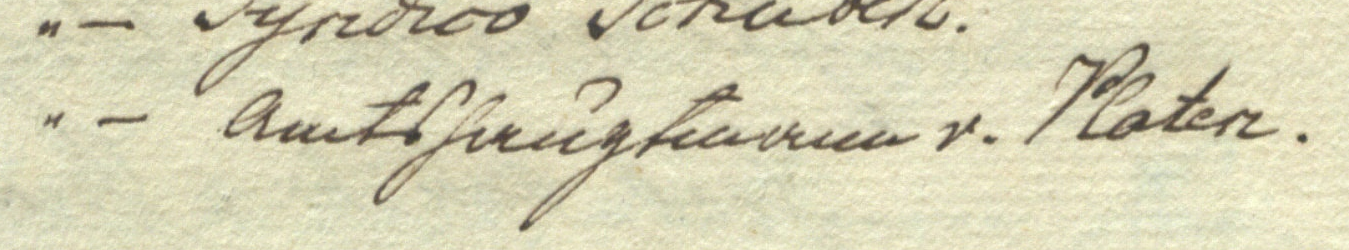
Amtshauptmann v. Platen.
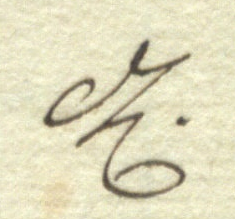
dh.
